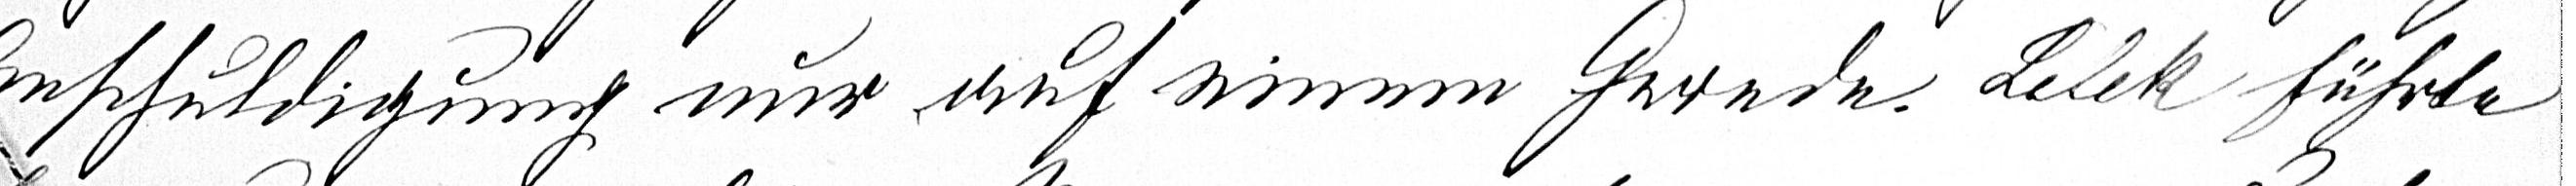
Anschuldigung nur auf einem Gerede. Lelek führte
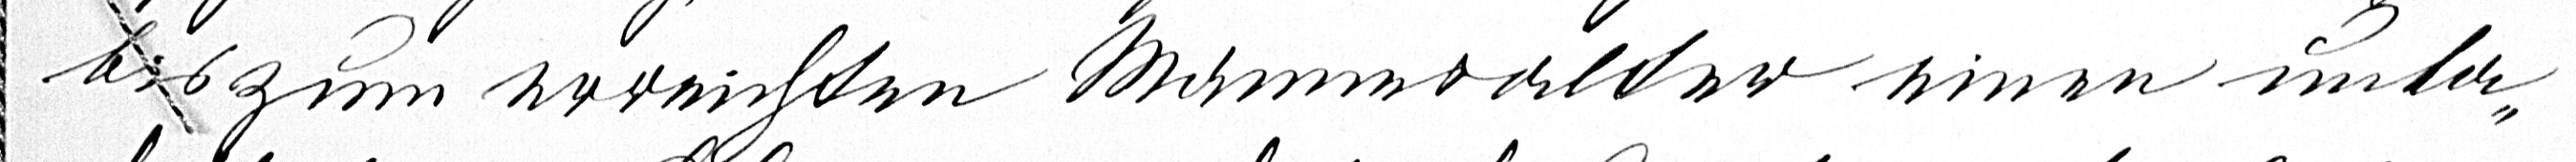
bis zum erreichten Mammoalter einen unta¬
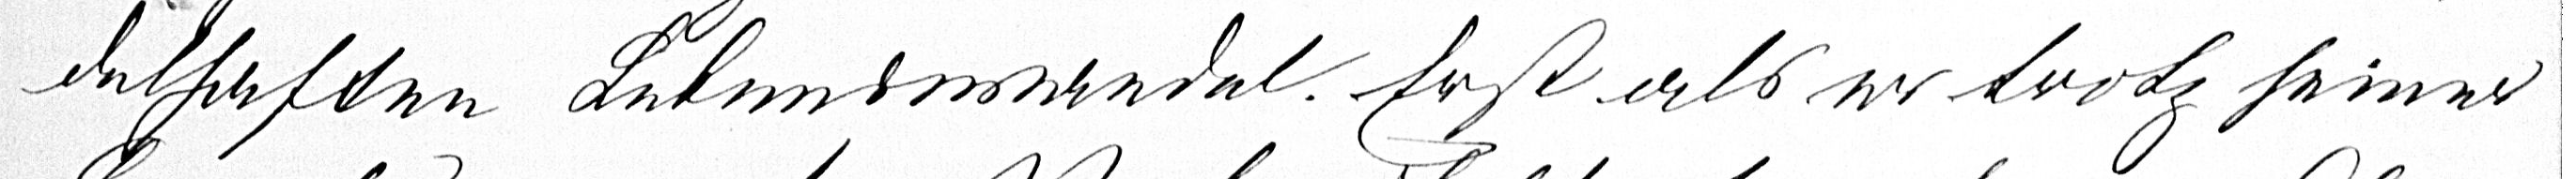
delhaften Lebenswandel. Erst als er trotz seiner
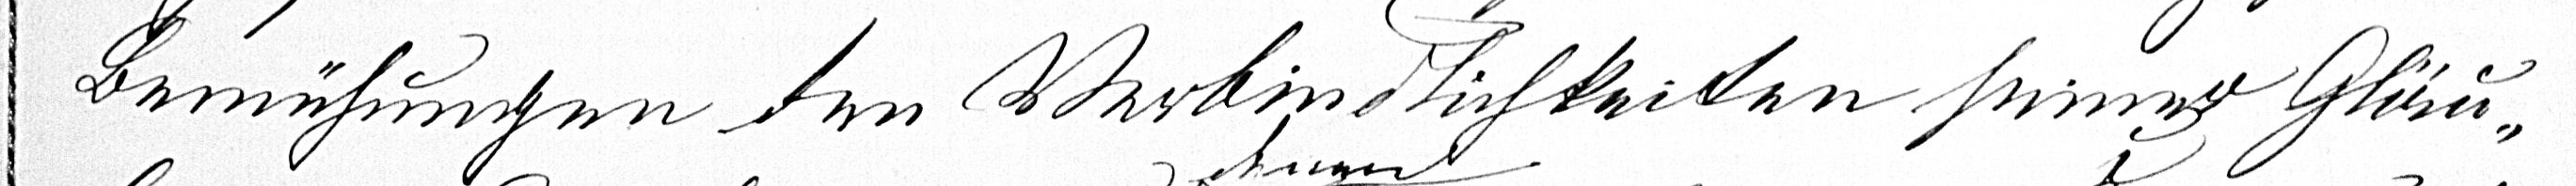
Bemühungen den Verbindlichkeiten seiner Gläu¬
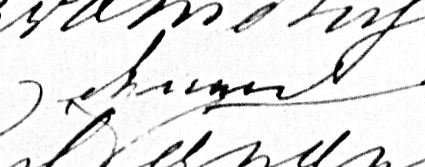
denen
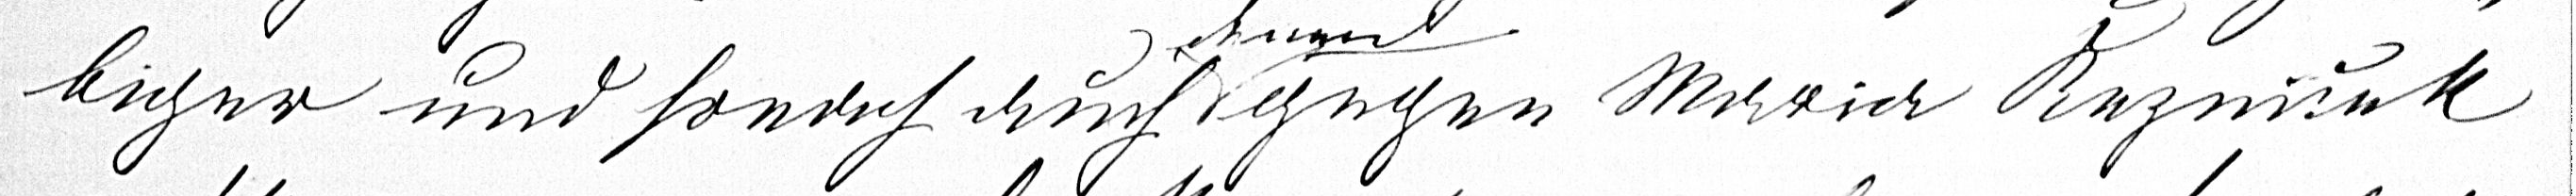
biger und sonach durch gegen Maria Rezniček
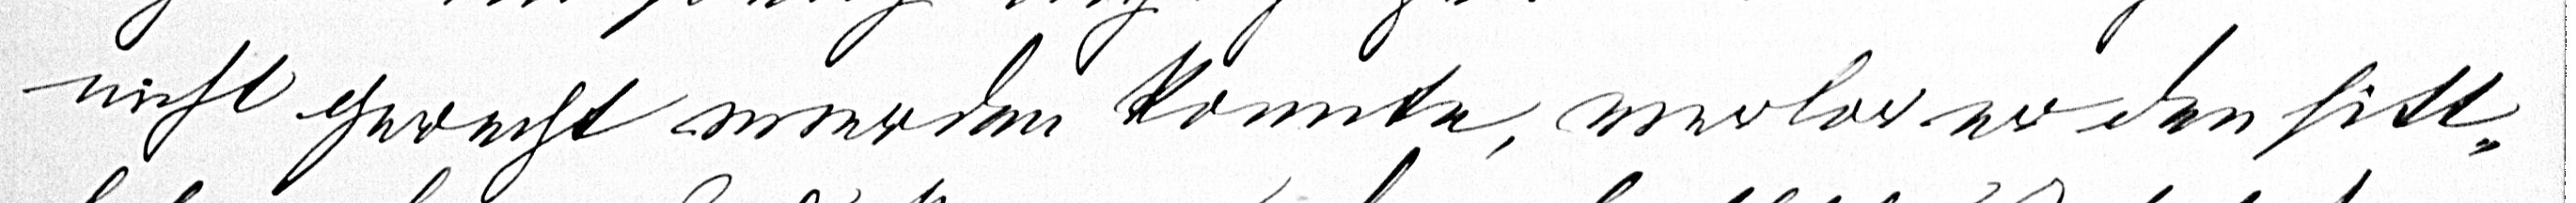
nicht gerecht werden konnte, verlor er den sitt¬
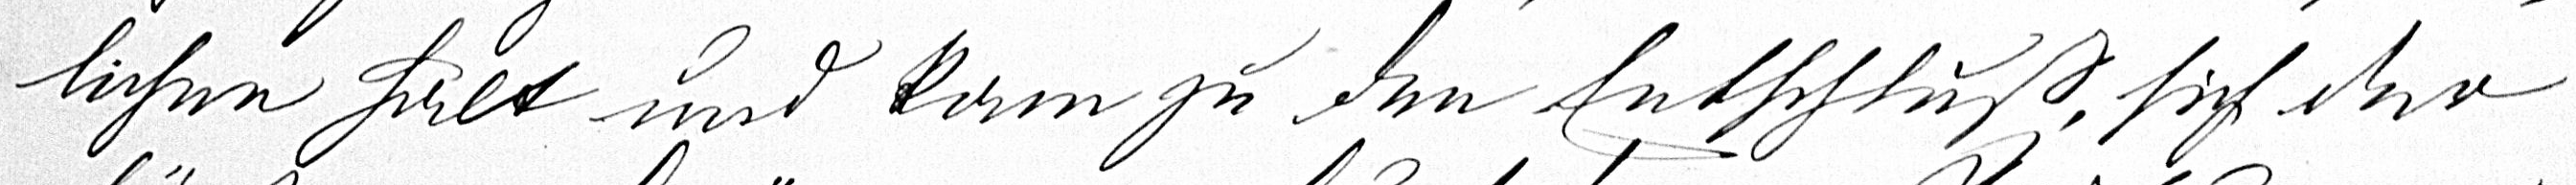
lichen halt und kam zu den Entschluß, sich der
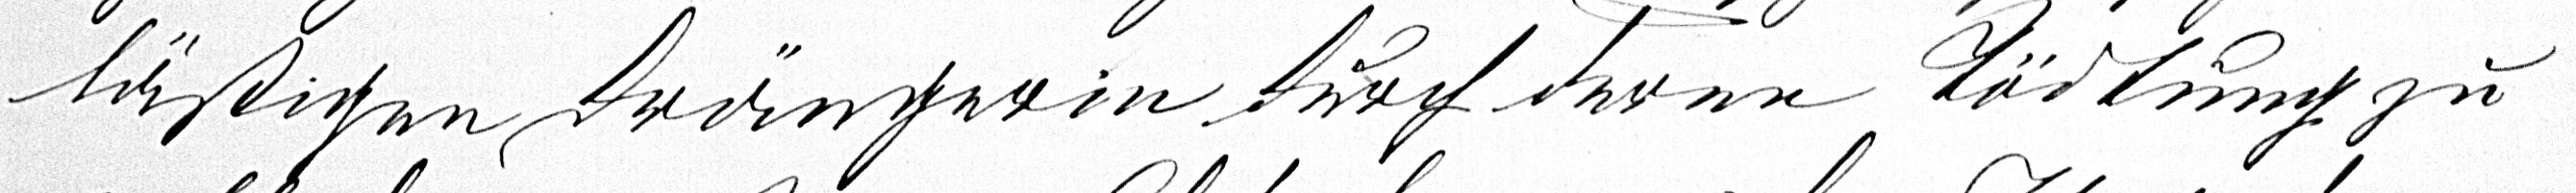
läßigen Drängerin durch deren Tödtung zu
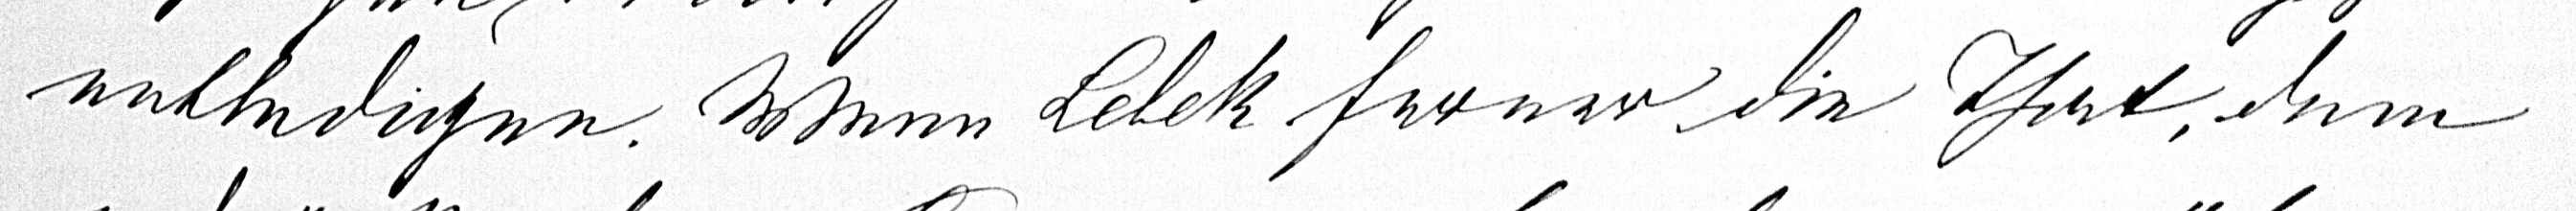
entledigen. Wenn Lelek ferner die That, dem
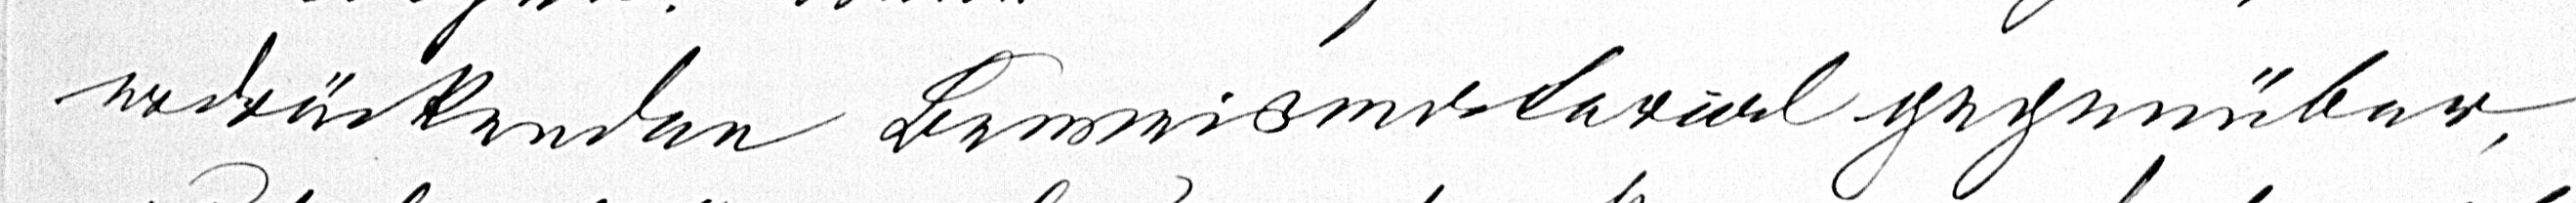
erdrückenden Beweismaterial gegenüber,
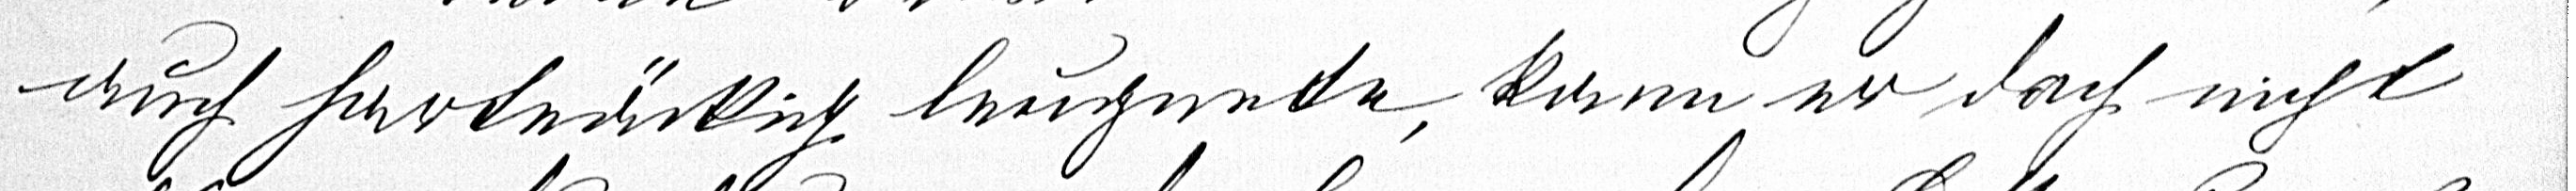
auch hartnäckig leugnete, kann er doch nicht
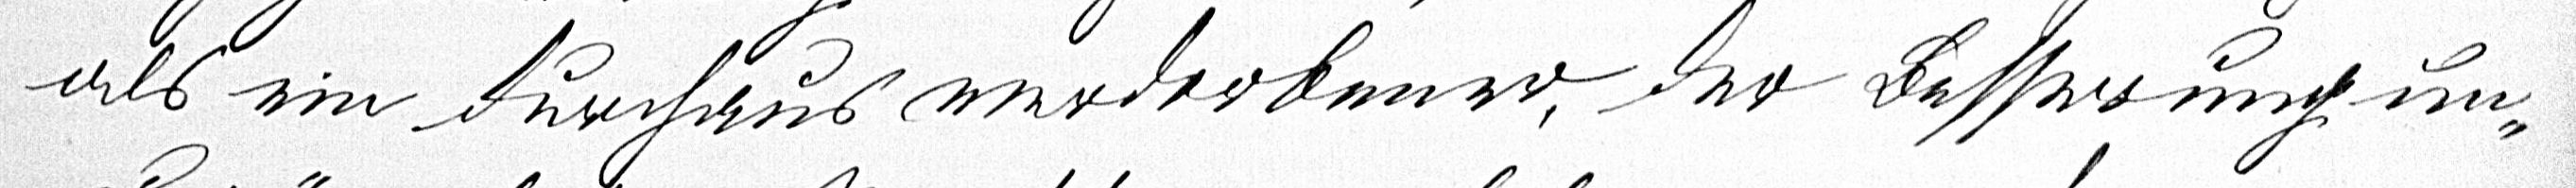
als ein Durchaus verdorbener, der Besserung un¬
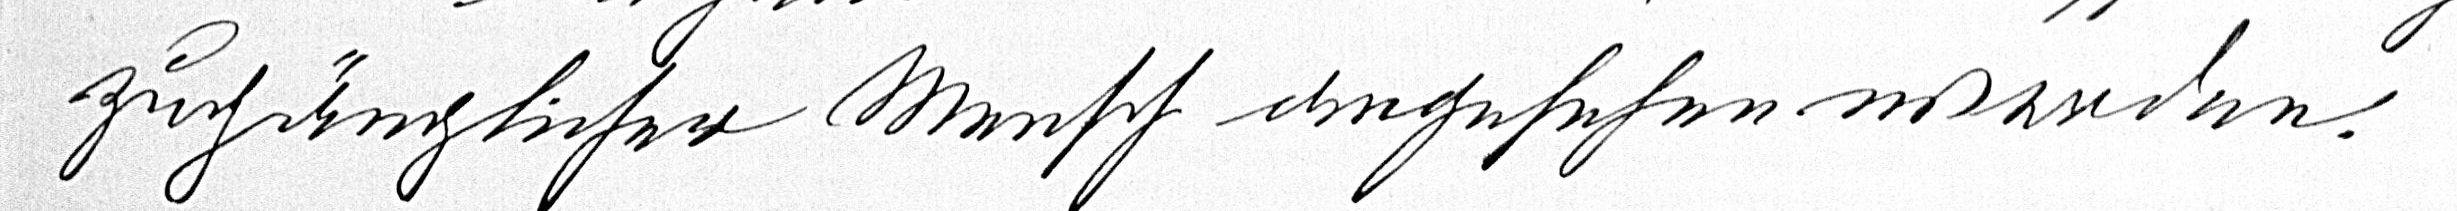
zugänglicher Mensch angesehen werden.
